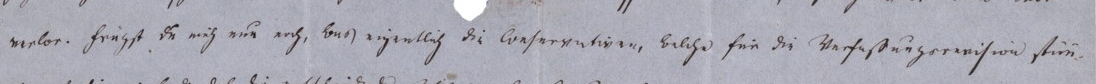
verlor. Frägst du mich nun noch, was eigentlich die Conservativen, welche für die Verfassungsrevision stim-
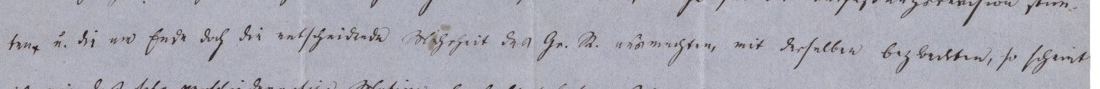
mten u. die am Ende doch die entscheidende Mehrheit des Gr. R. ausmachten, mit derselben bezweckten, so scheint
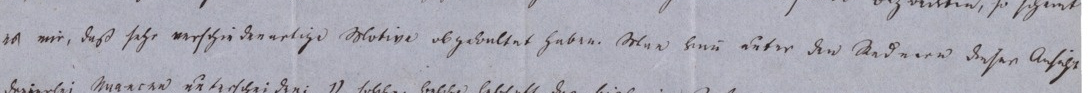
es mir, daß sehr verschiedenartige Motive obgewaltet haben. Man kann unter den Rednern dieser Ansicht
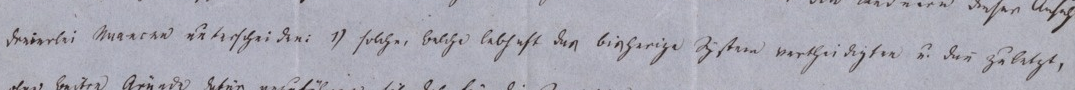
dreierlei Nuancen unterscheiden: 1) solche, welche lebhaft das bisherige System vertheidigten u. dann zuletzt,
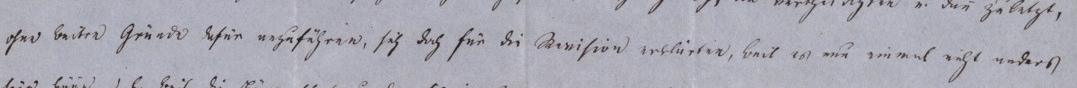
ohne weitre Gründe dafür anzuführen, sich doch für die Revision erklärten, weil es nun einmal nicht anders
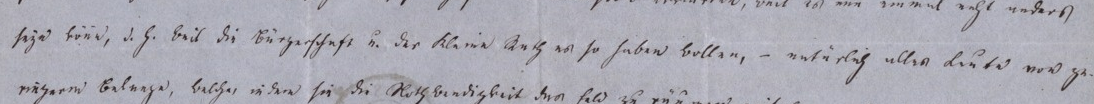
seyn könne, d. h. weil die Bürgerschaft u. der kleine Rath es so haben wollen, – natürlich alles Leute von ge-
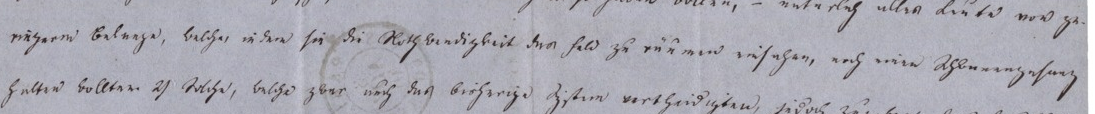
ringem Belange, welche, indem sie die Nothwendigkeit das Feld zu räumen einsahen, noch einen Schwanengesang
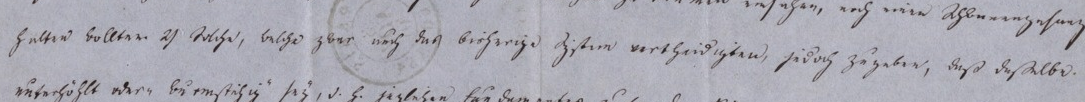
halten wollten 2) Solche, welche zwar auch das bisherige System vertheidigten, jedoch zugaben, daß dasselbe
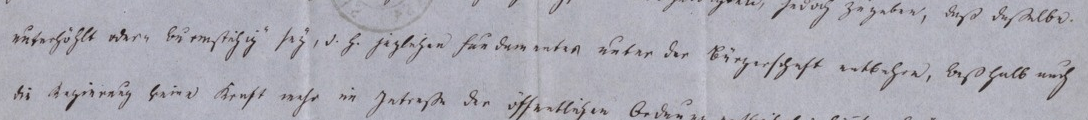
unterhöhlt oder «wurmstichig» sey, d. h. jeglichen Fundamentes unter der Bürgerschaft entbehre, weßhalb auch
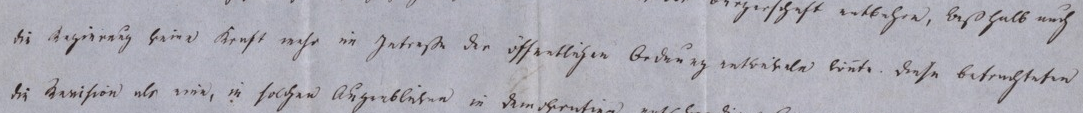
die Regierung keine Kraft mehr im Intresse der öffentlichen Ordnung entwickeln könnte. Diese betrachteten
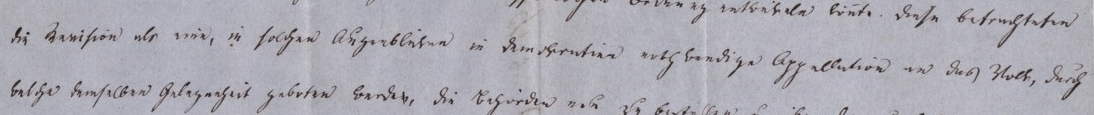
die Revision als eine, in solchen Augenblicken in Demokratien nothwendige Appellation an das Volk, durch
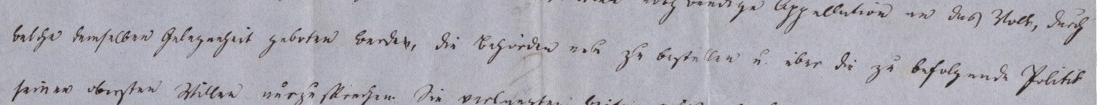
welche demselben Gelegenheit geboten werde, die Behörden neu zu bestellen u. über die zu befolgende Politik
